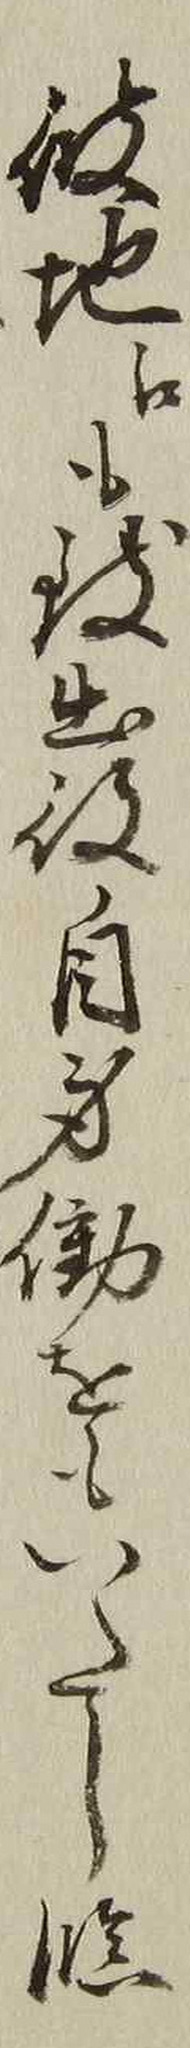彼地江も致出役自身働をもいたし臨
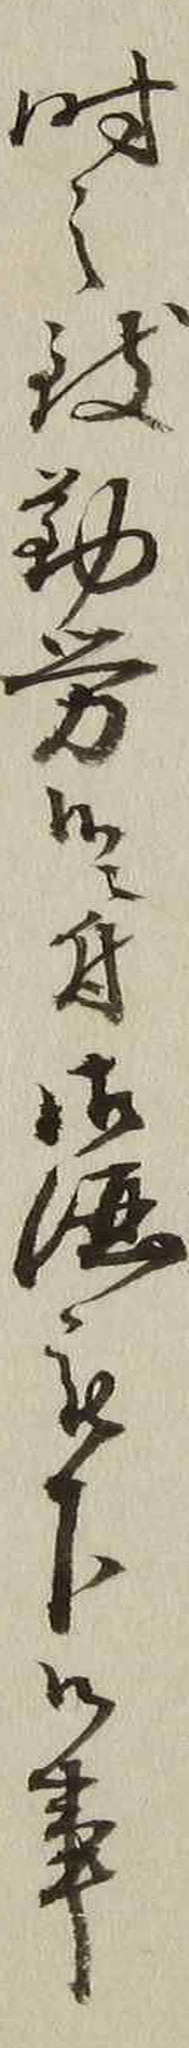時之致勤労候ニ付御酒被下候事
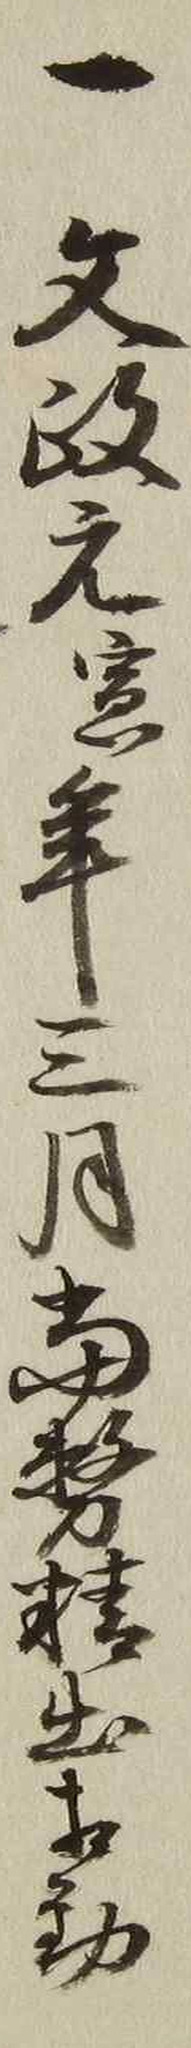一文政元寅年三月当務精出相勤
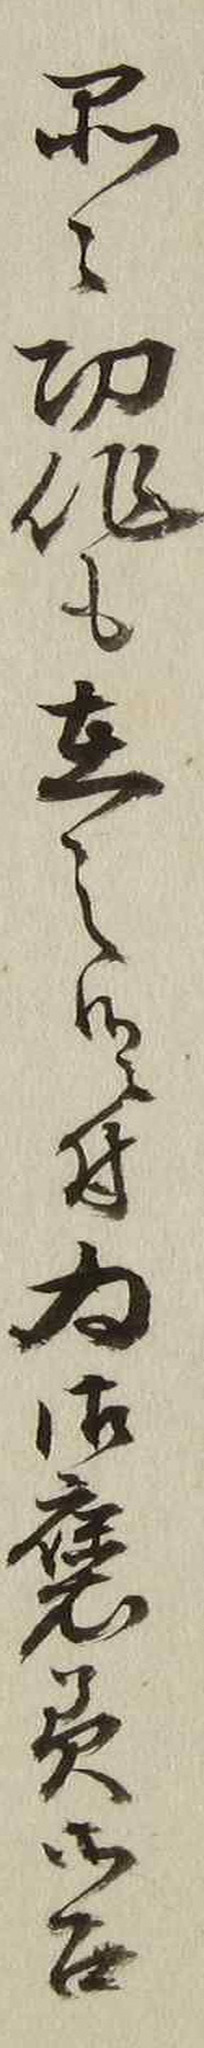品々功作も在之候ニ付為御褒美御召
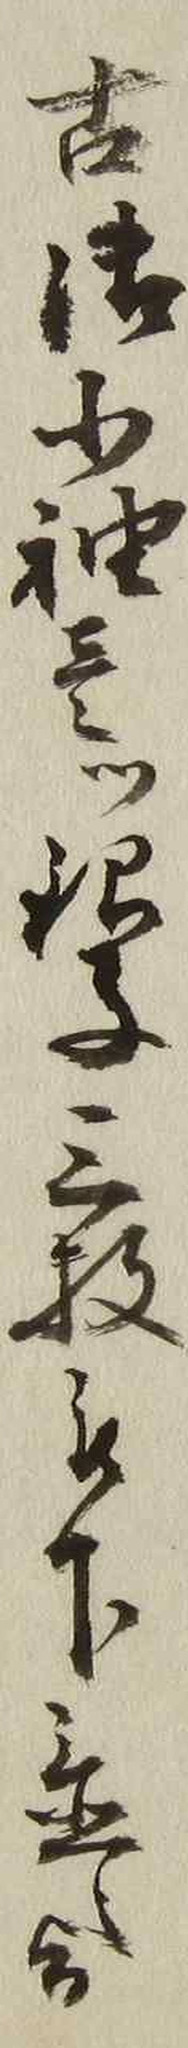古御少袖壱ツ銀子三枚被下置之旨
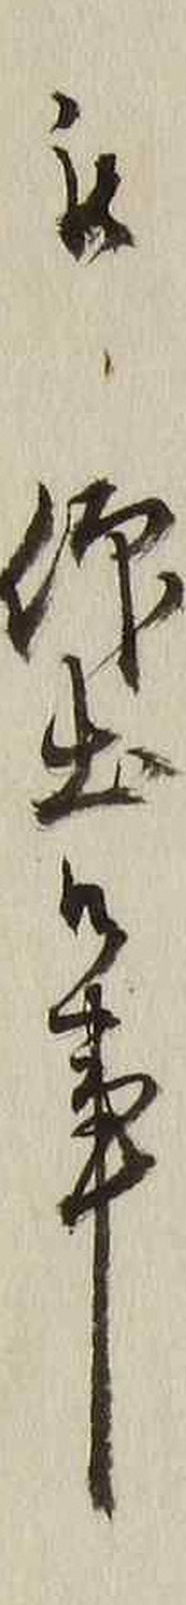被仰出候事
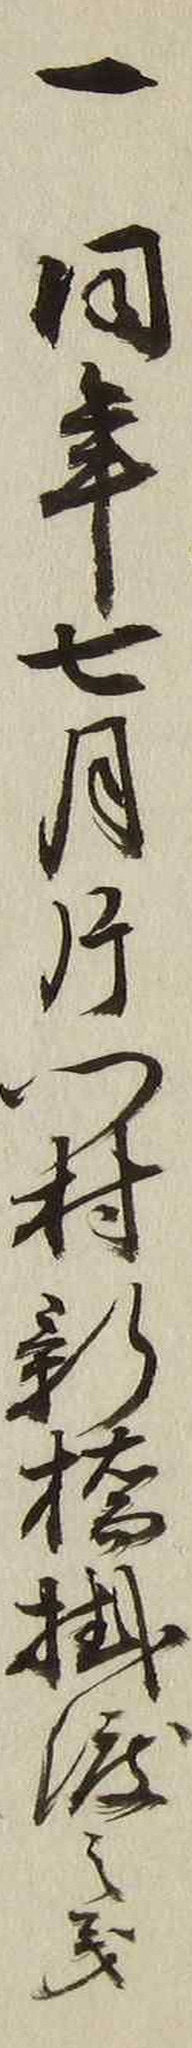一同年七月片門村新橋掛渡之義
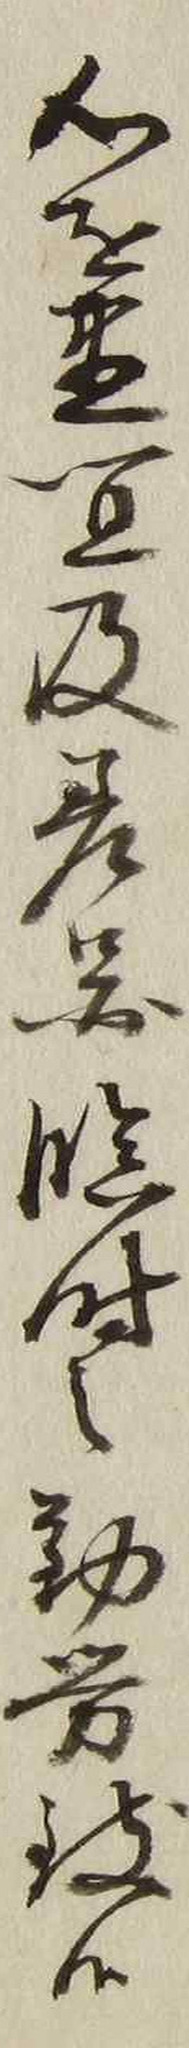心を尽宜及差図臨時之勤労致候
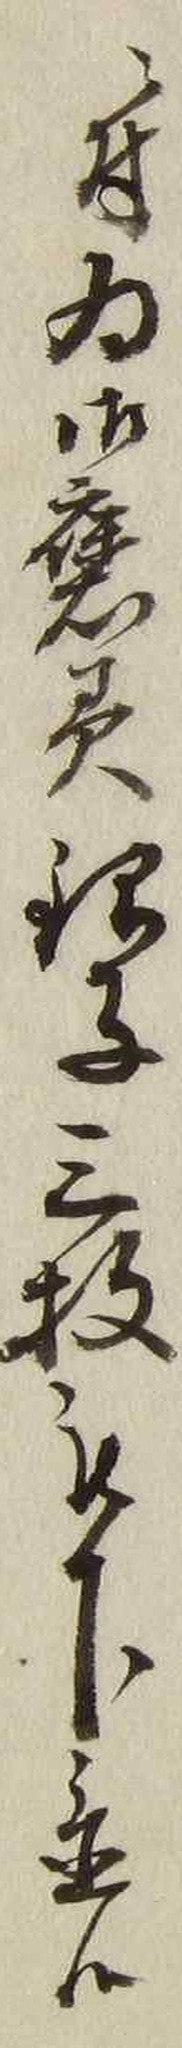ニ付為御褒美銀子三枚被下置候

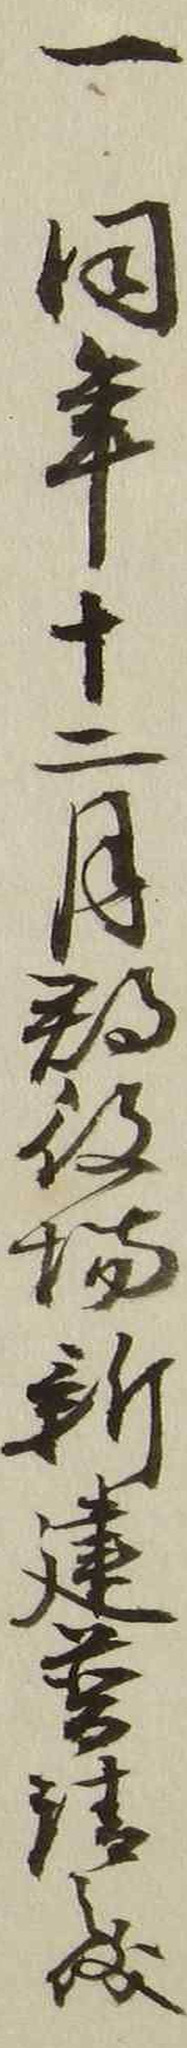一同年十二月郡役場新建普請之儀
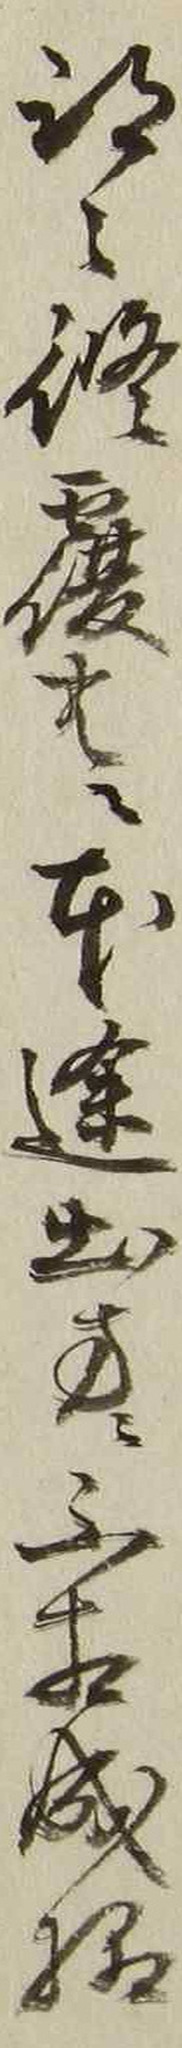跡々修覆共ニ本途出方ニ不相成様
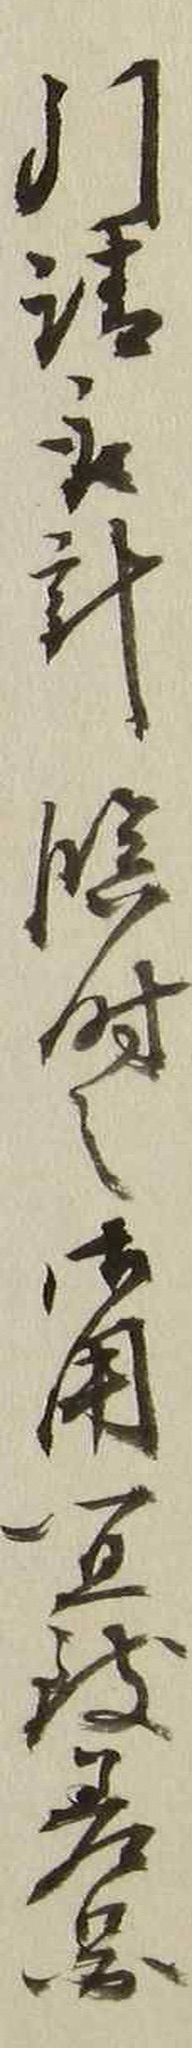引請取計臨時之御用宜致差図
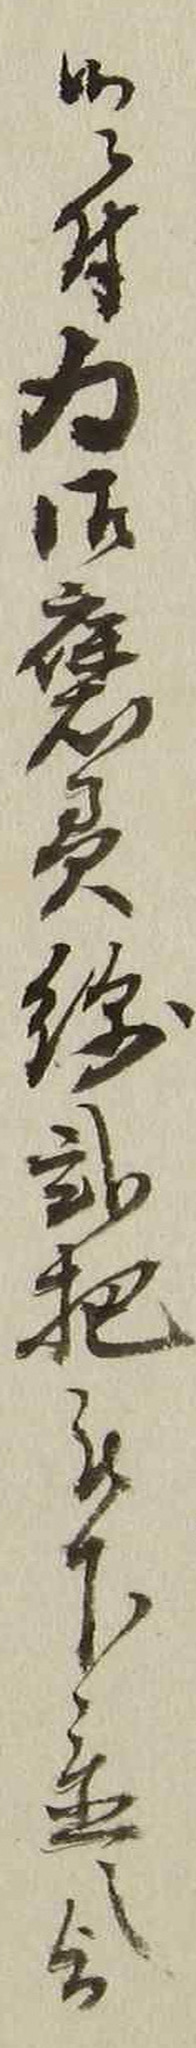候ニ付為御褒美綿弐把被下置之旨
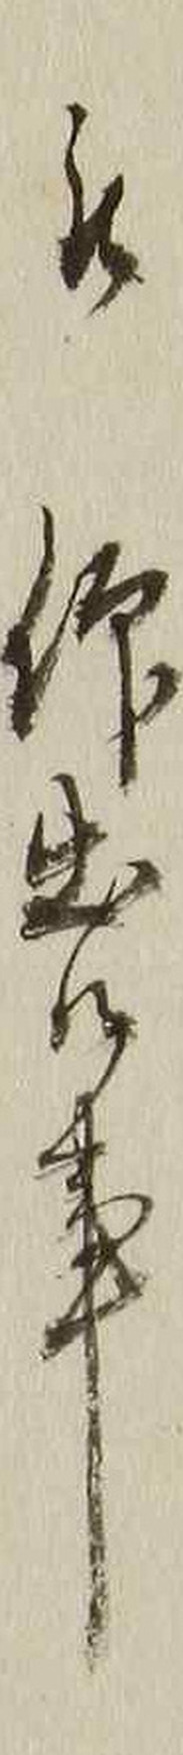被仰出候事
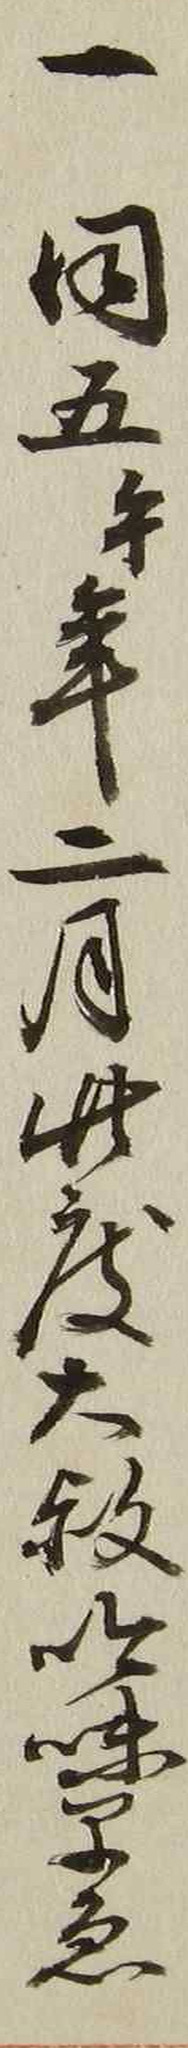一同五午年二月此度大赦吟味早急
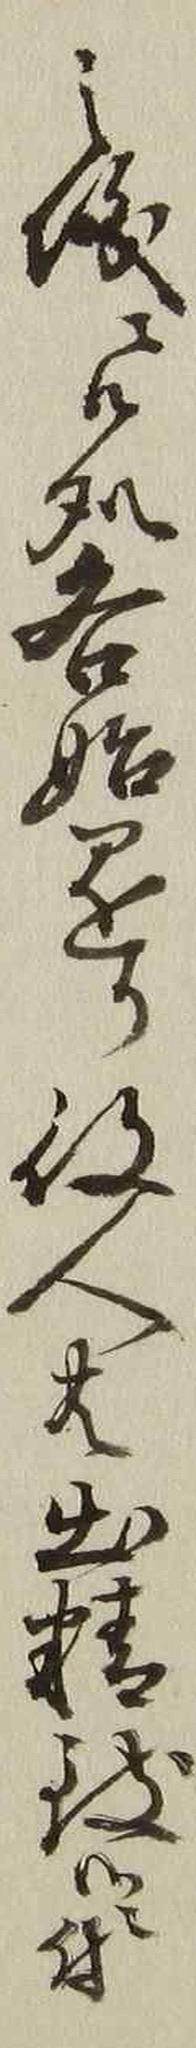之儀ニ候処各始懸り役人共出精致候ニ付
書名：諸士系譜　巻之23　い之部23
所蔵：会津若松市立会津図書館
